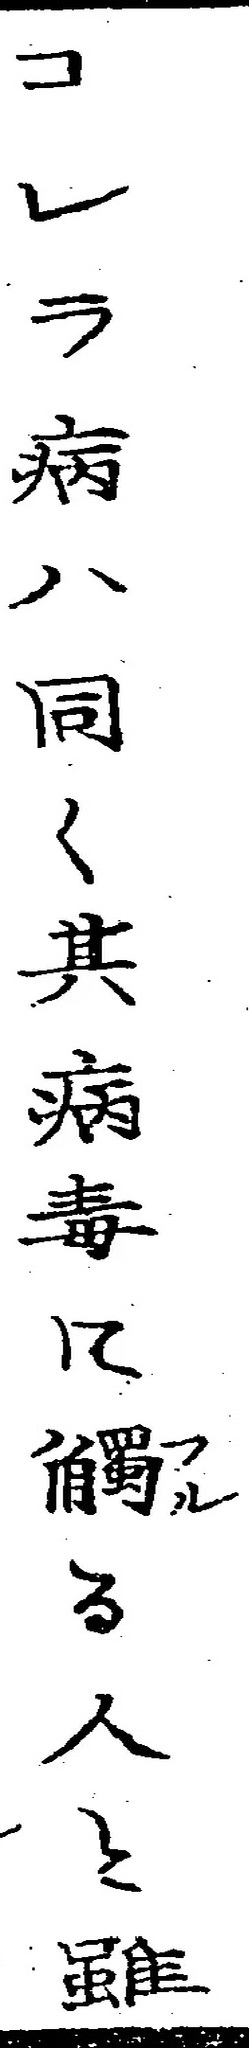コレラ病は同く其病毒に觸る人と雖
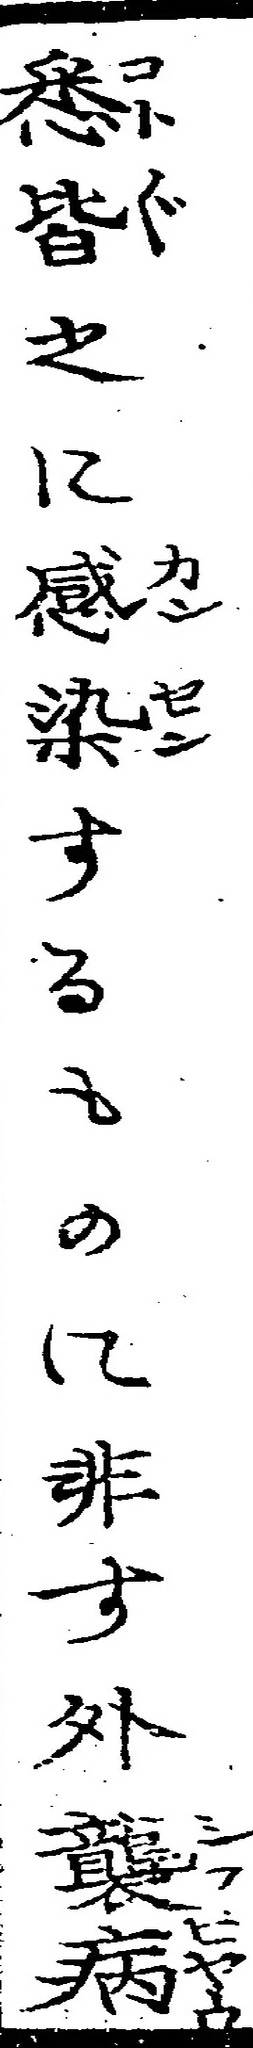悉皆之に感染するものに非す外襲病
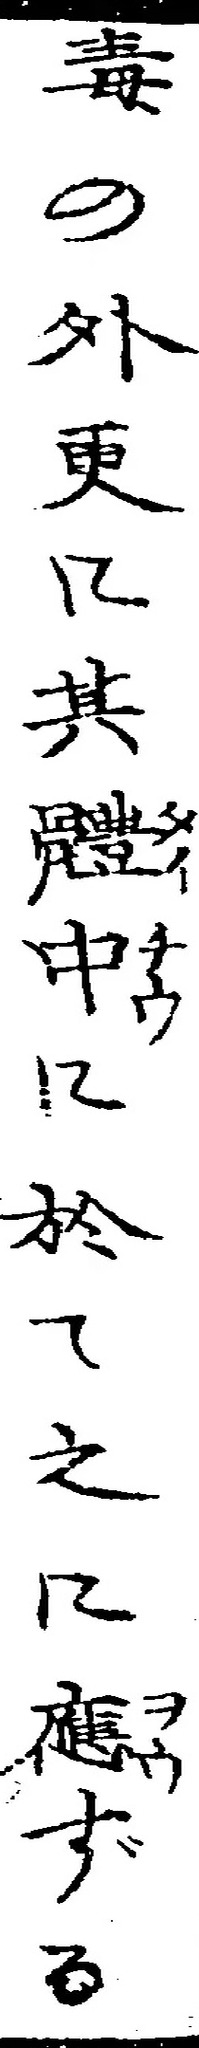毒の外更に其體中に於て之に應ずる
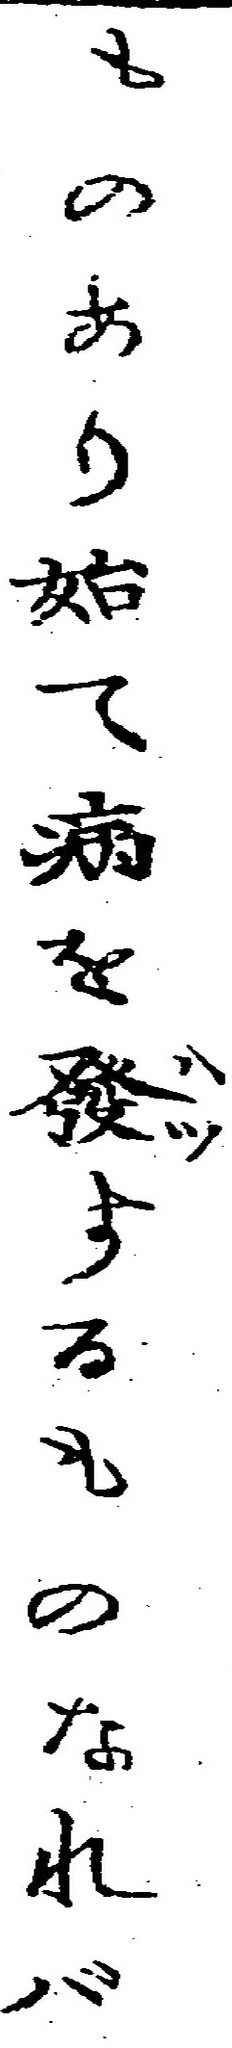ものあり始て病を發するものなれば
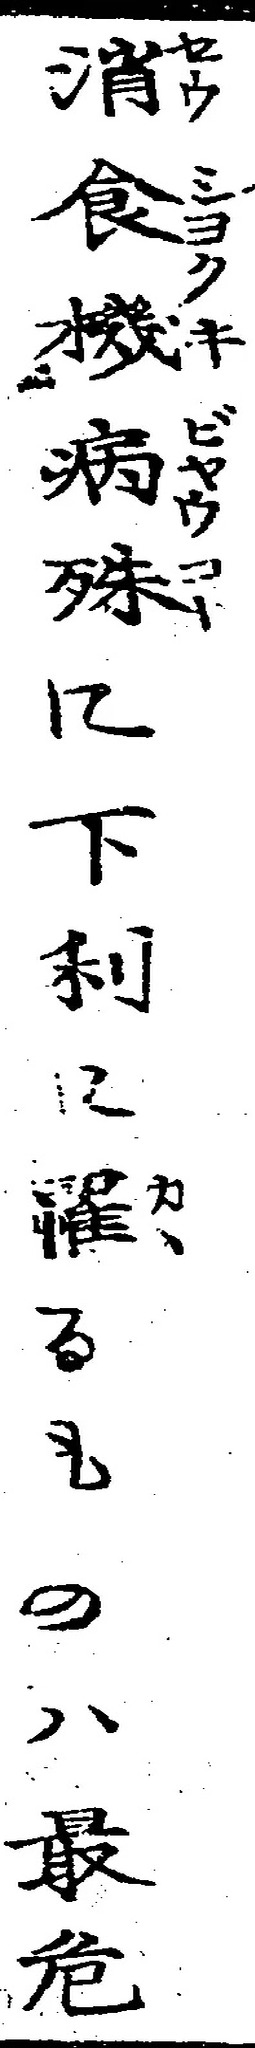消食機病殊に下利に罹るものは最危
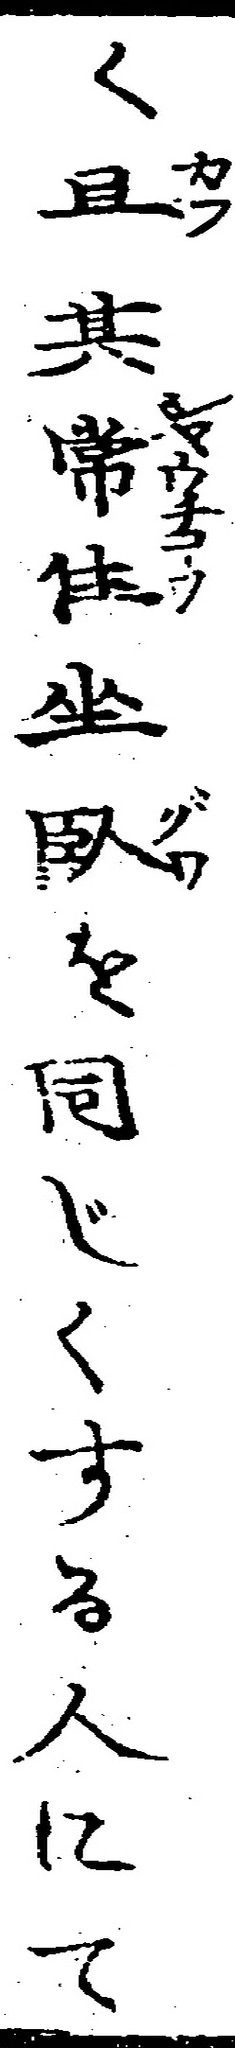く且其常住坐臥を同じくする人にて
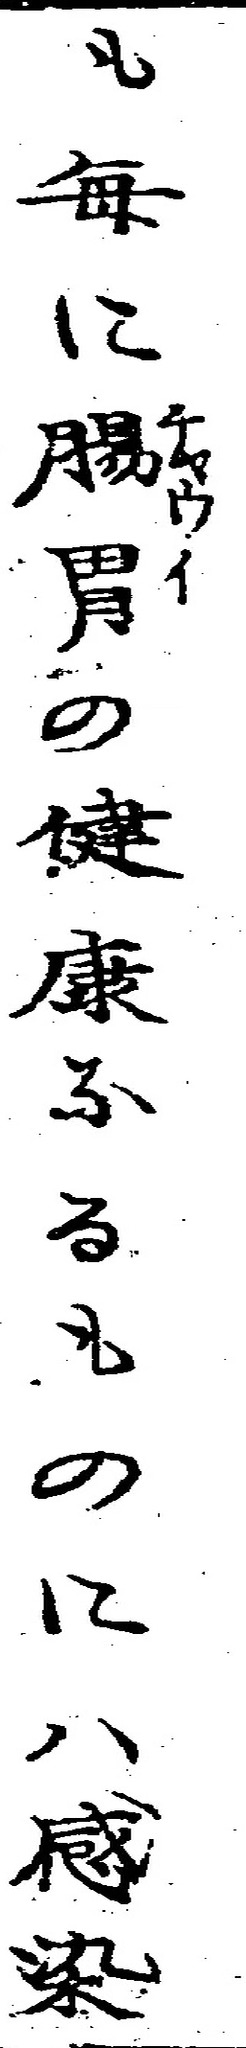も毎に腸胃の健康なるものには感染
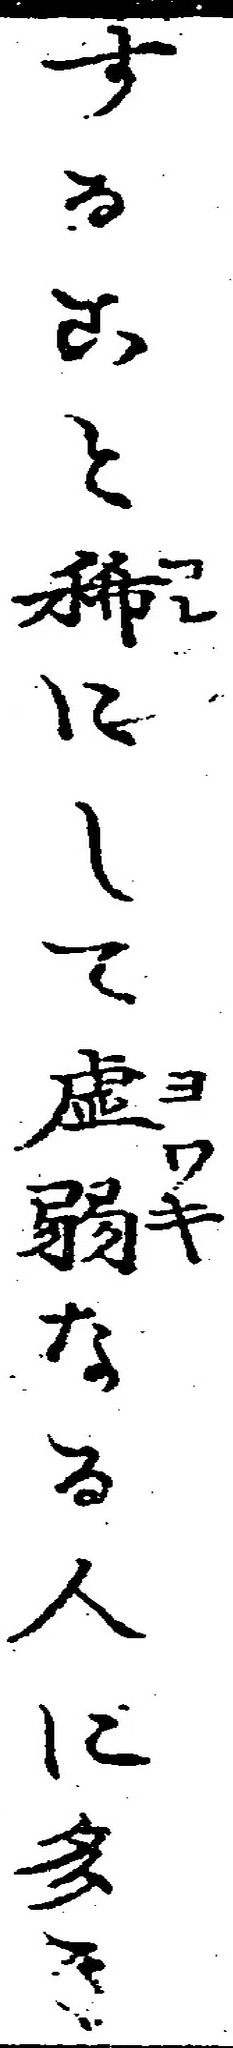すること稀にして虚弱なる人に多き
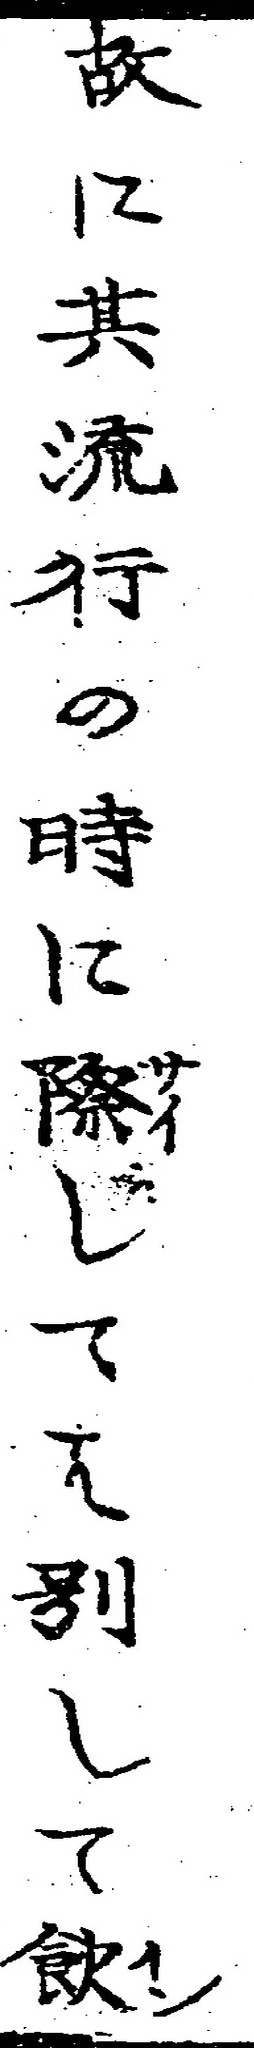故に其流行の時に際しては別して飲
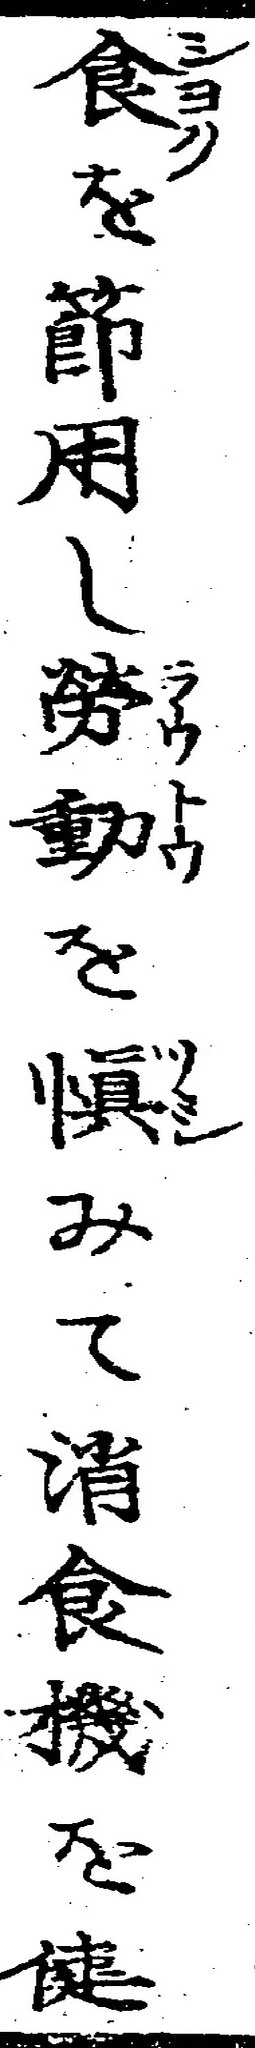食を節用し労動を謹みて消食機を健

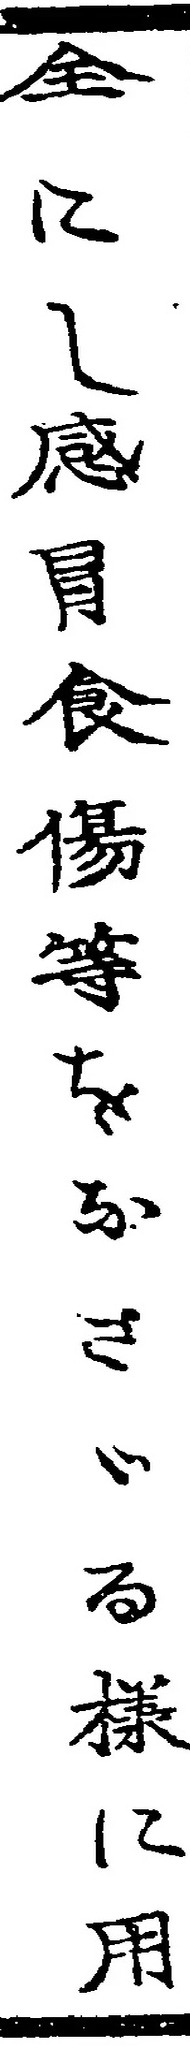全にし感冒食傷等をなさゞる様に用
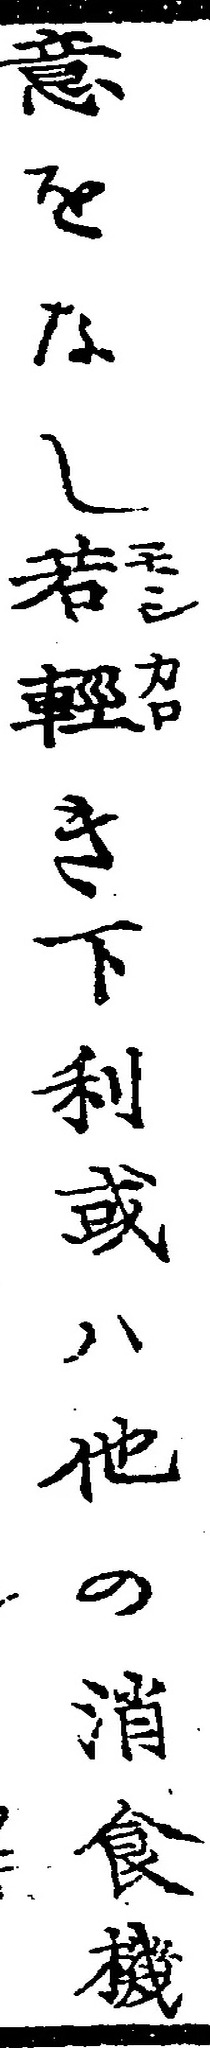意をなし若軽き下利或は他の消食機
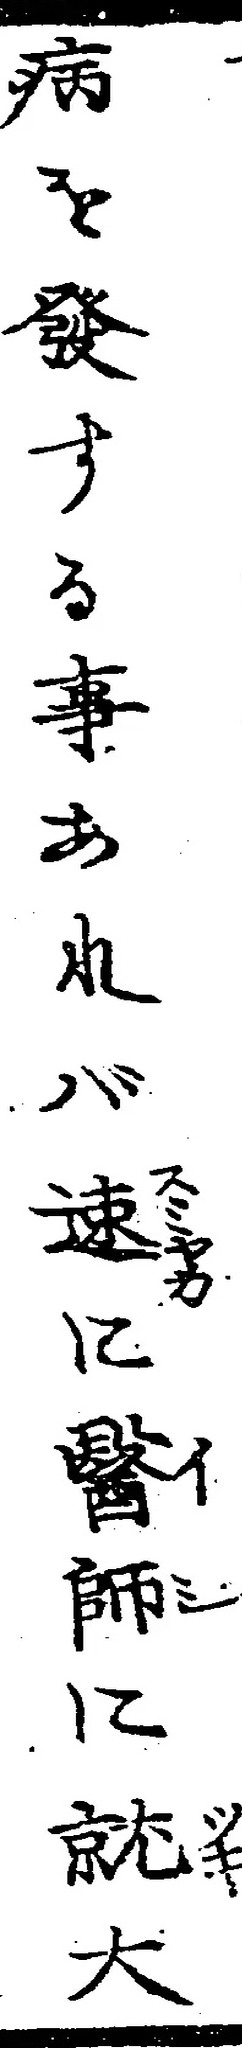病を發する事あれば速に醫師に就て大
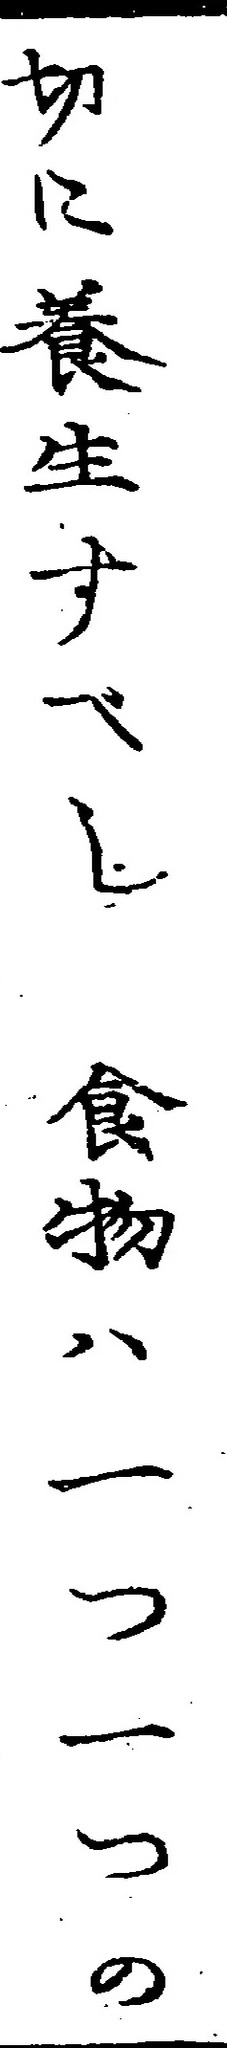切に養生すべし食物は一つ一つの
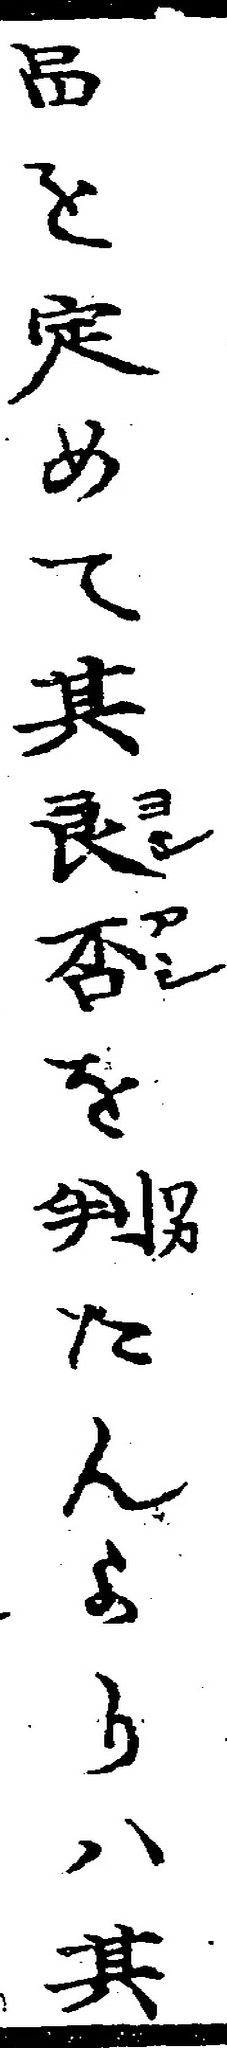品と定めて其良否を判たんよりは其
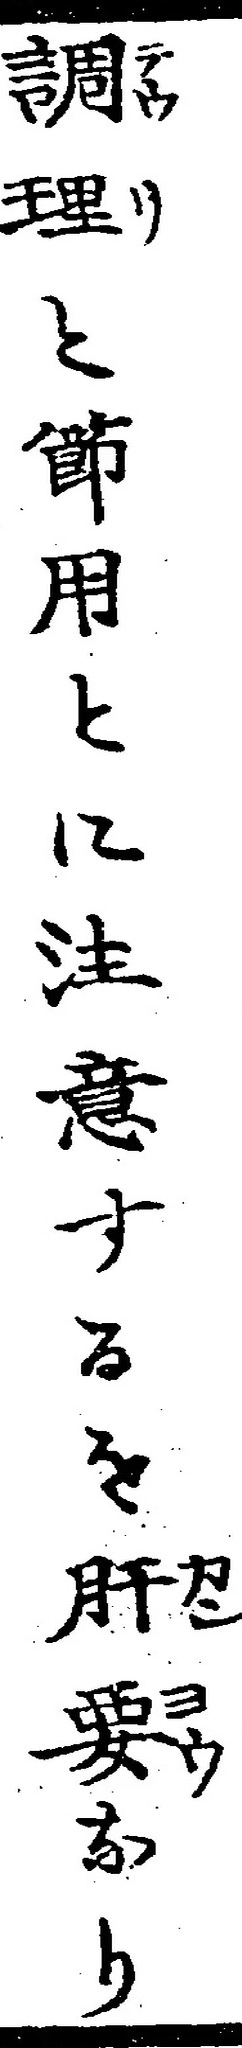調理と節用とに注意するを肝要なり
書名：虎列剌病予防用法
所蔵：国立国会図書館 National Diet Library, JAPAN
